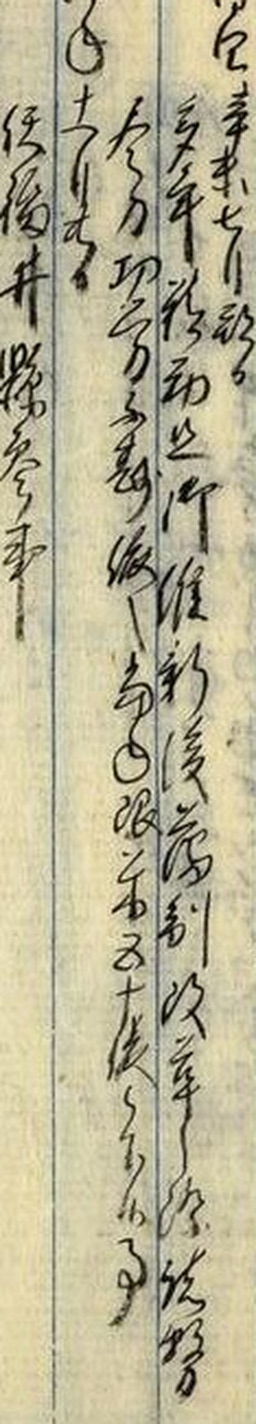尽力功労不尠依之当年限米五十俵被下候事
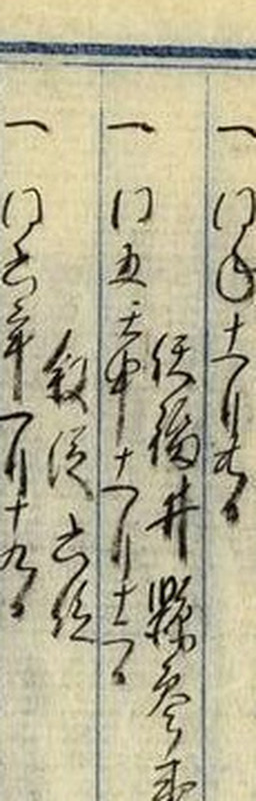一同五壬申十一月十二日
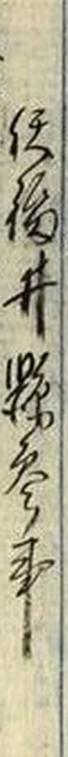任福井県参事
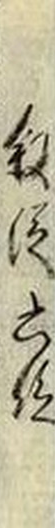叙従六位
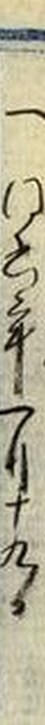一同六年一月十九日
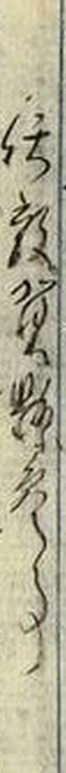任敦賀県参事
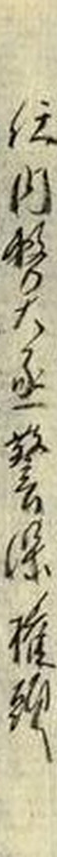任内務大丞警保権頭
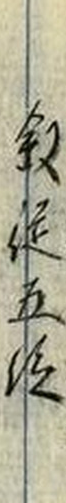叙従五位
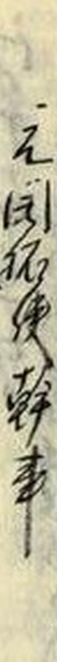元開拓使幹事
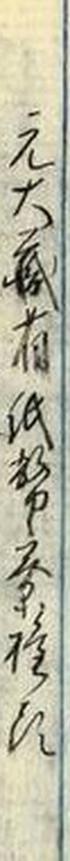元大蔵省紙幣寮権頭
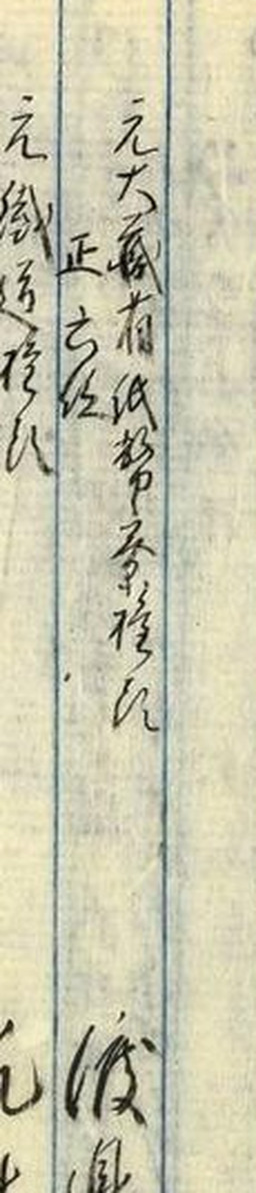元大蔵省紙幣寮権頭
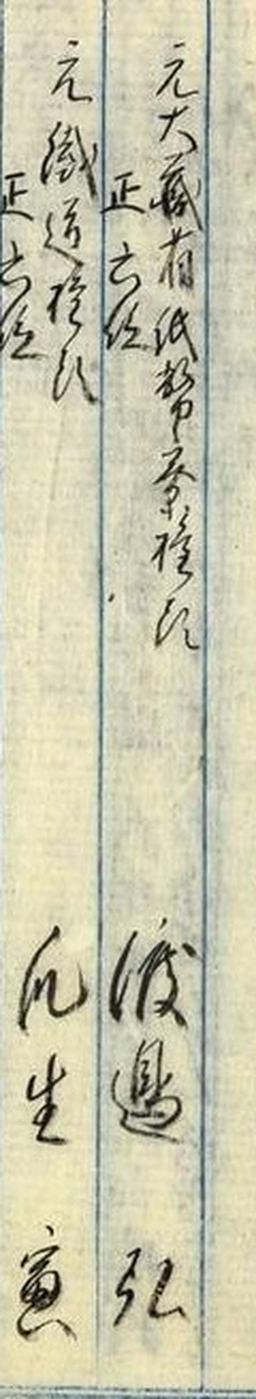正六位渡辺弘
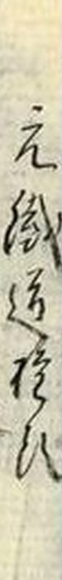元鉄道権頭
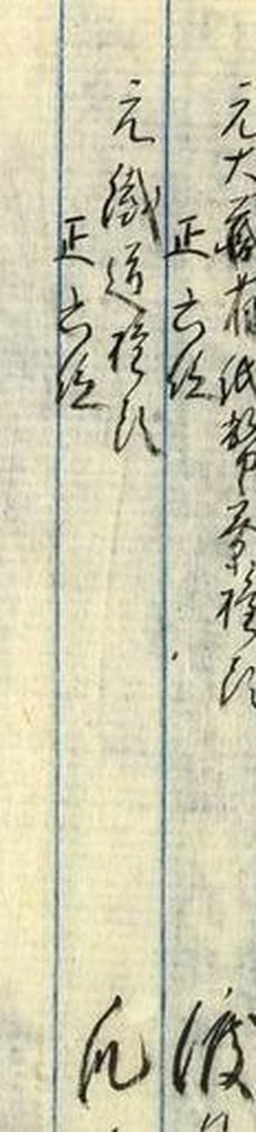元鉄道権頭
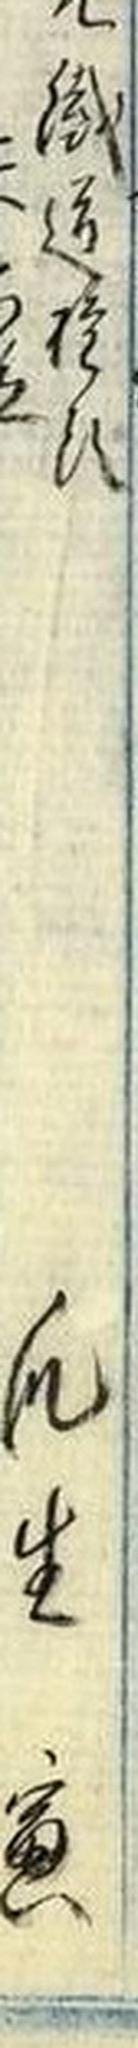正六位瓜生寅
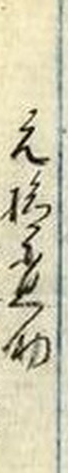元検査助
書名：温古集 三巻
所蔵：福井県文書館 Fukui Prefectural Archives
